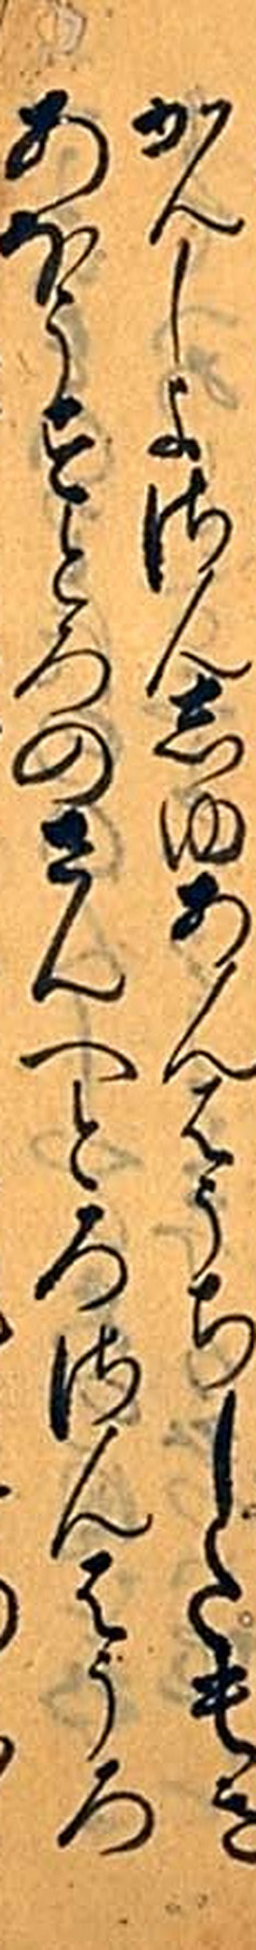あほうすとろのさんへとろさんはうろ
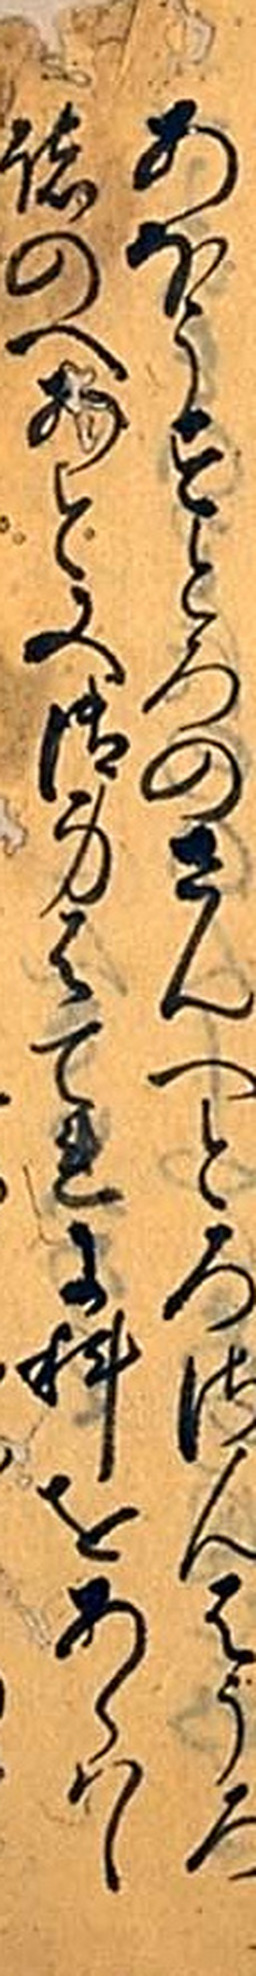諸のへあと又御身はてれに科をあらはし
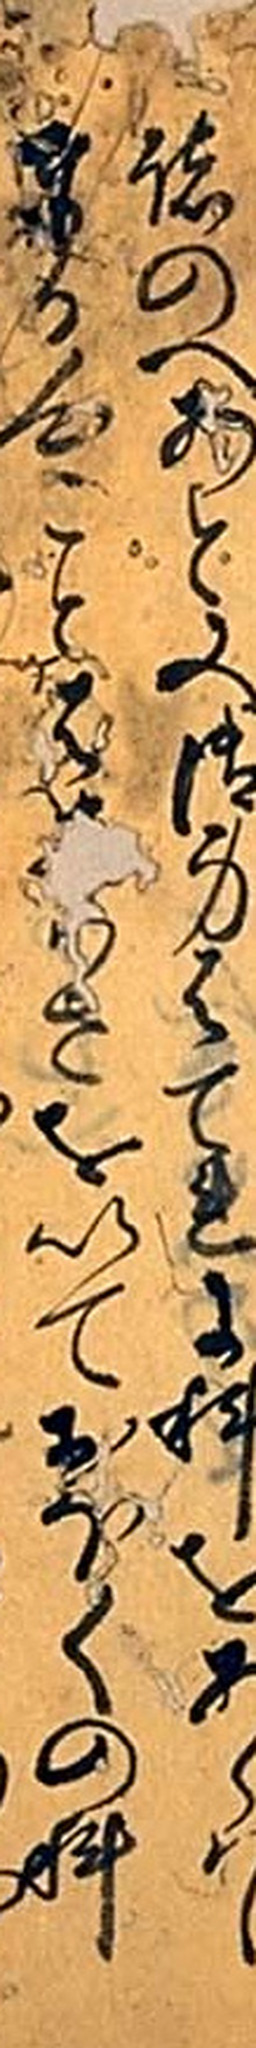奉る心ことはさを以ておほくの科
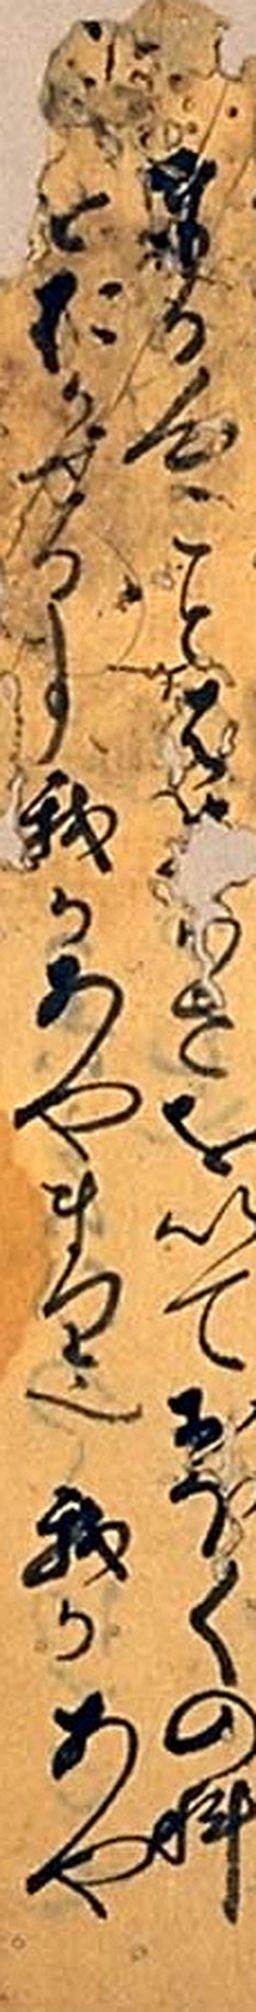をおかせる事我かあやまり也我かあや
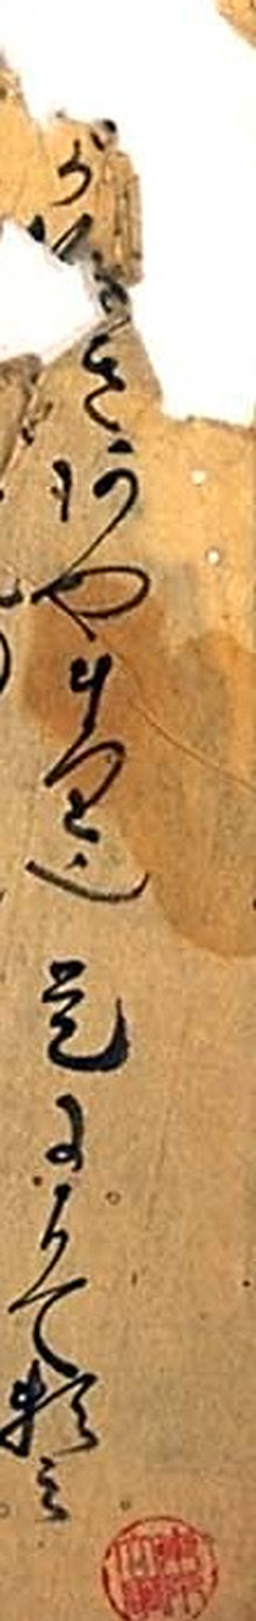きあやまり也是によて頼み
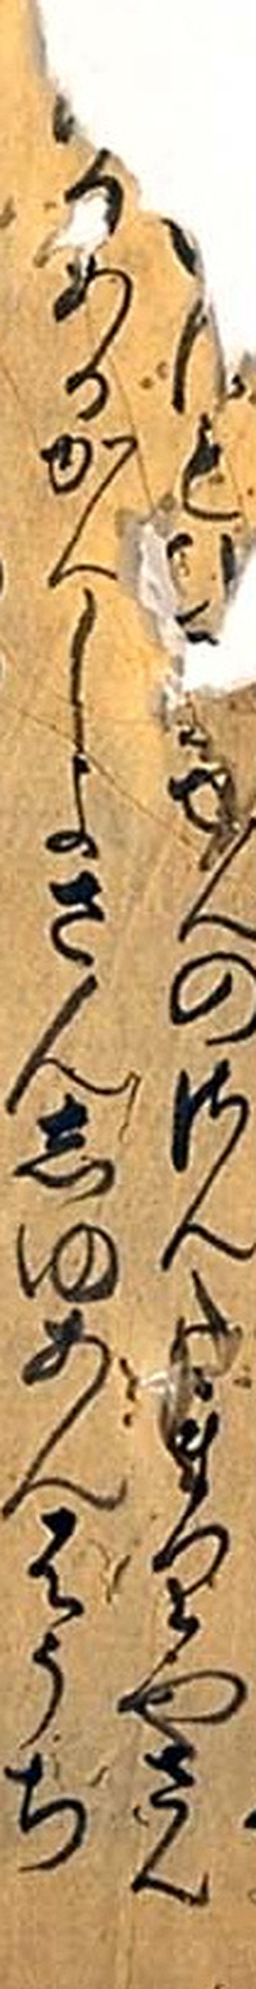あるかんしよさんしゆあんはうち
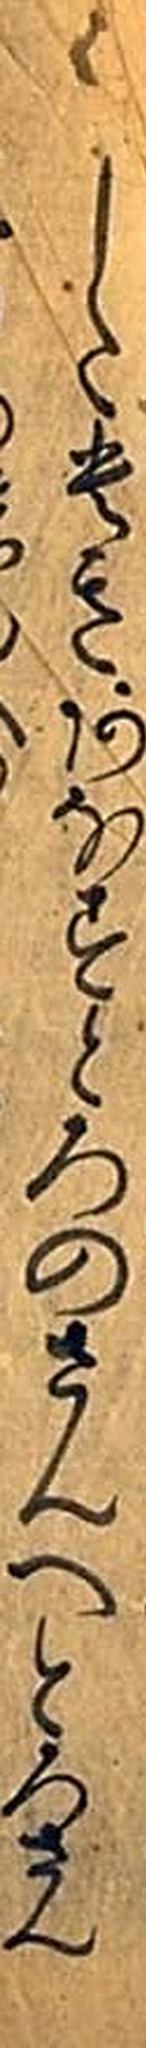した貴きあほすとろのさんへとろさん
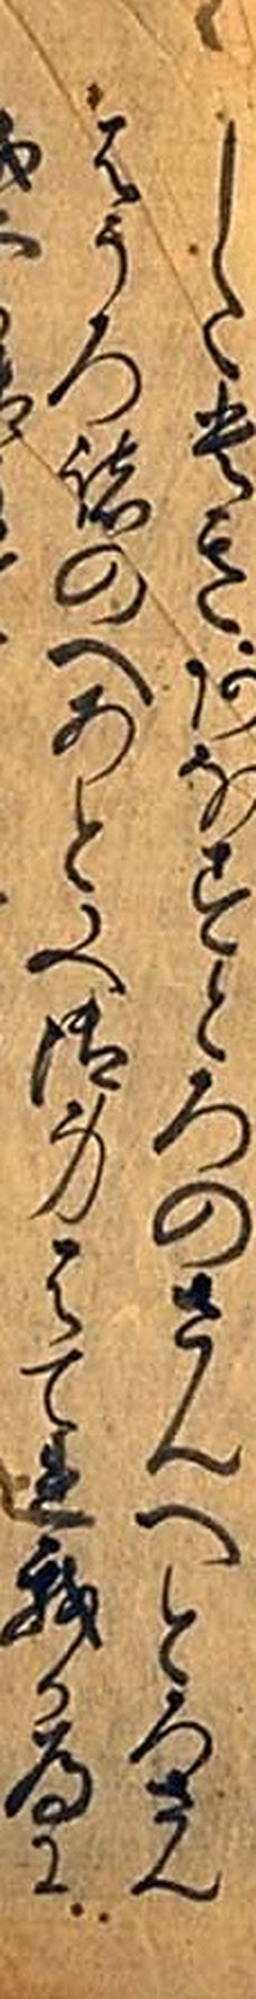はうろ諸のへあと又御身はてれ我か為に
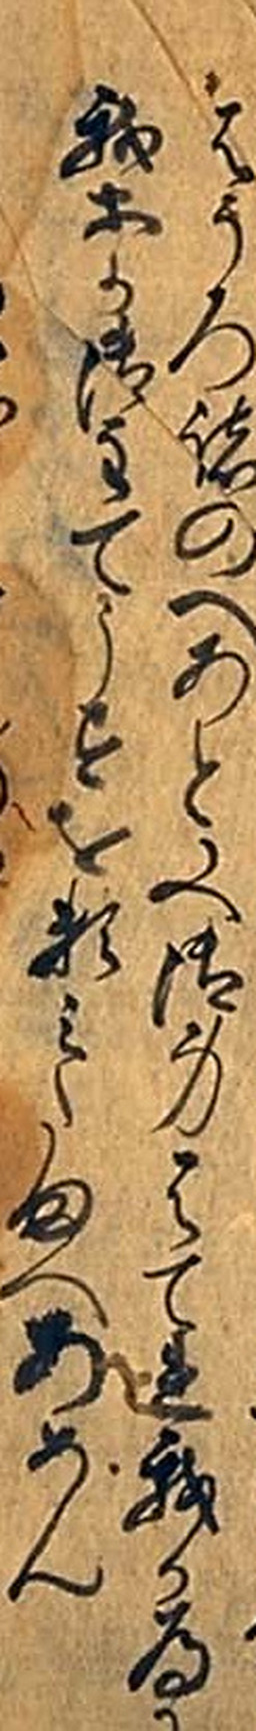我等か御主てうすを頼みたまへあめん
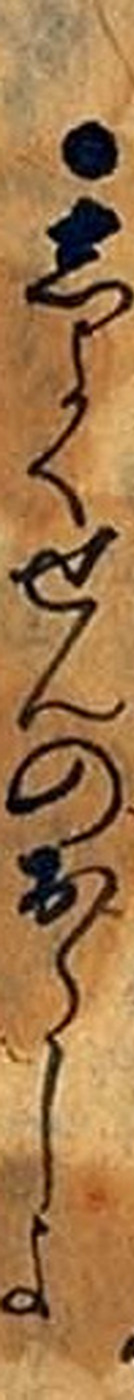○しよくせんのおらしよ
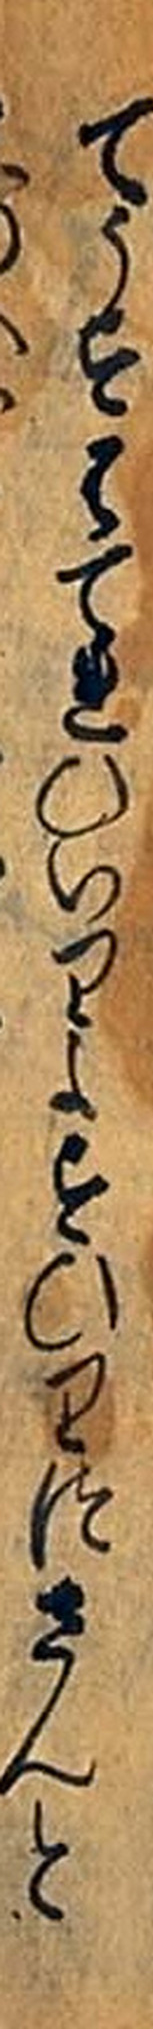てうすはてれひいりよすひりつさんと
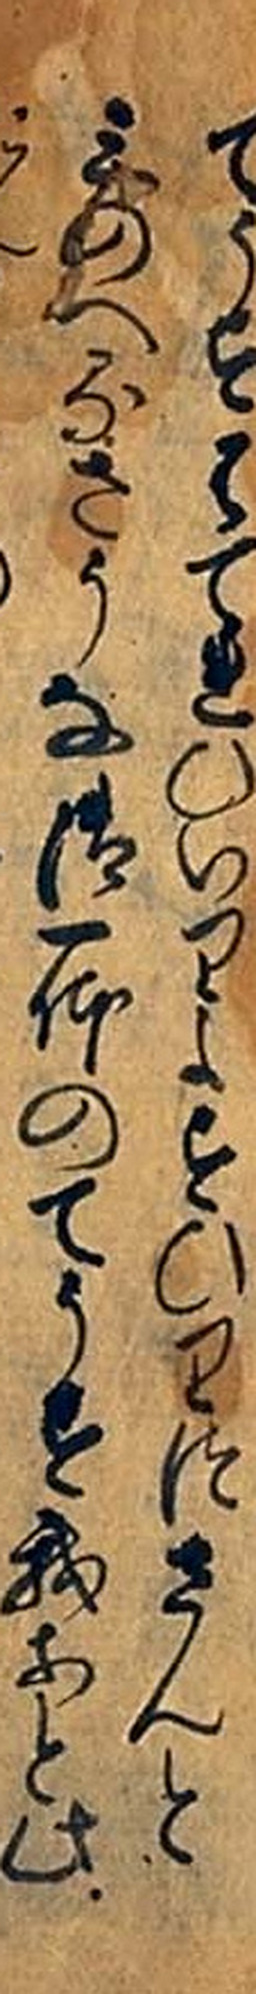三のへるさうな御一体のてうす我等と此
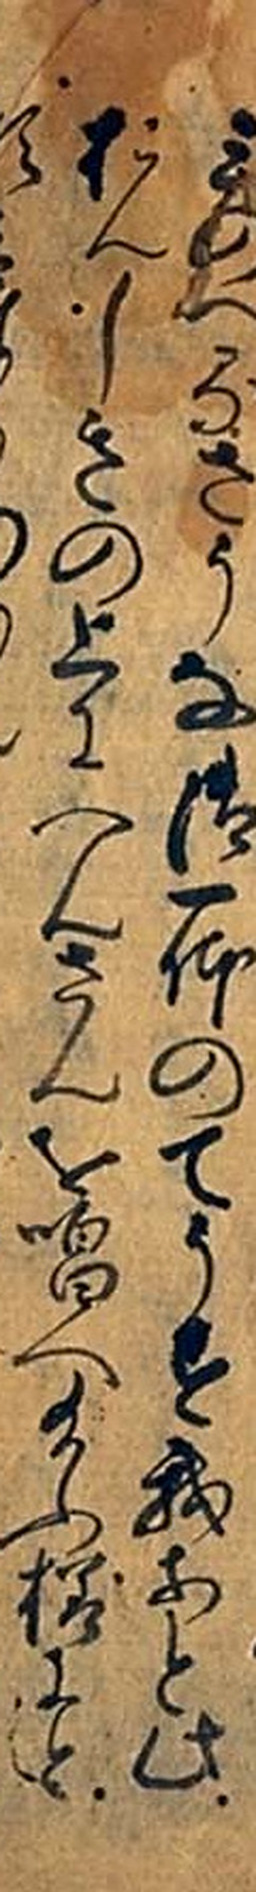おんしきの上にへんさんを唱へ給ふ様にと
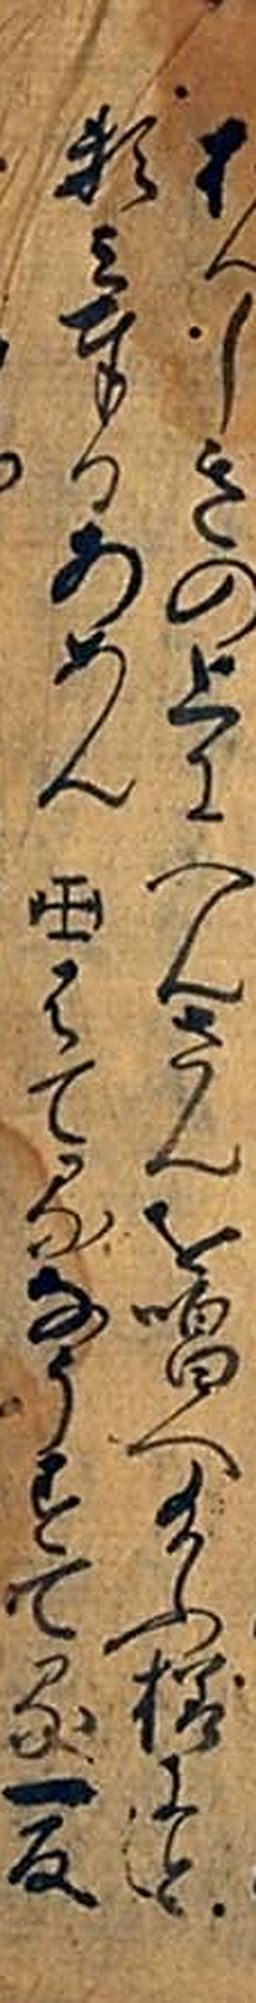頼み奉るあめん☩はてるなうすてる一反
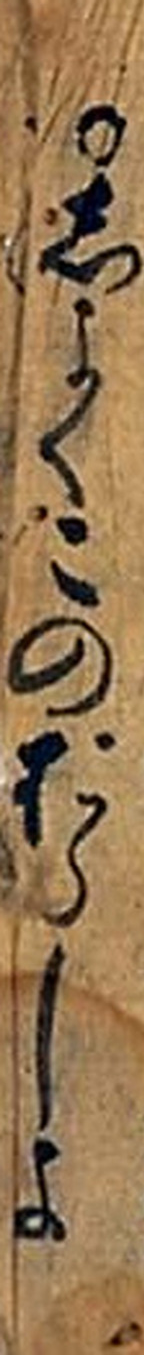○しよくこのおらしよ

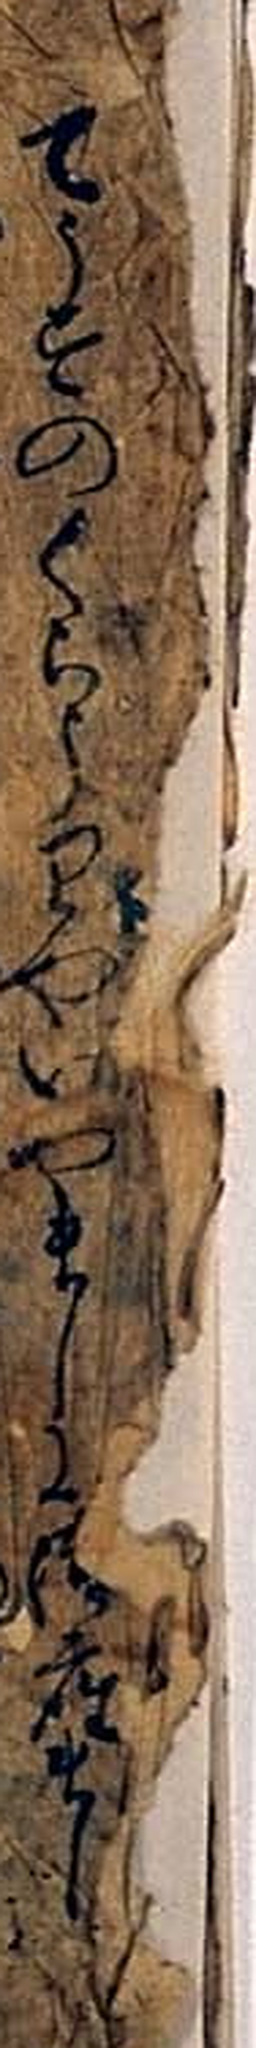てうすのくらうりやいやましに御座まし
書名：ドチリナ・キリシタン
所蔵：東京大学総合図書館 / General Library in the University of Tokyo
